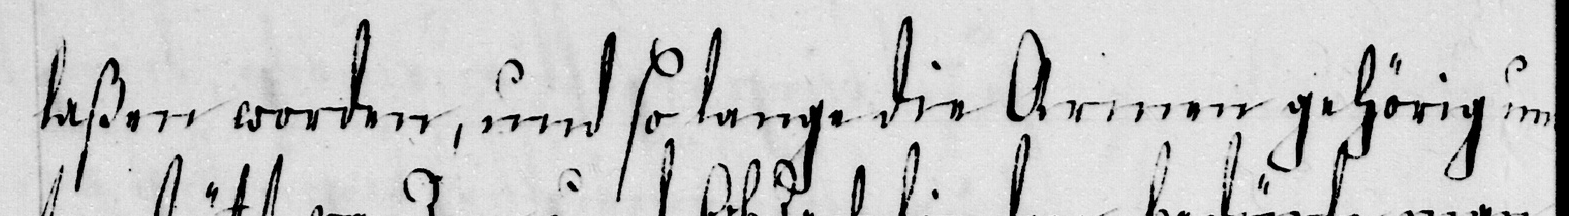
laßen worden, und so lange die Armen gehörig un¬
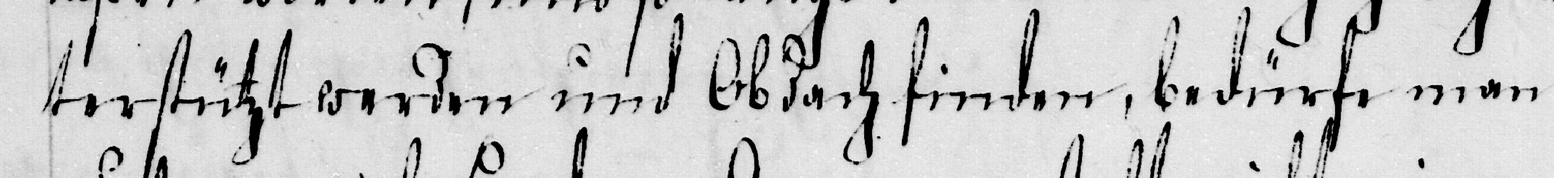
terstützt werden und Obdach finden, bedürfe man
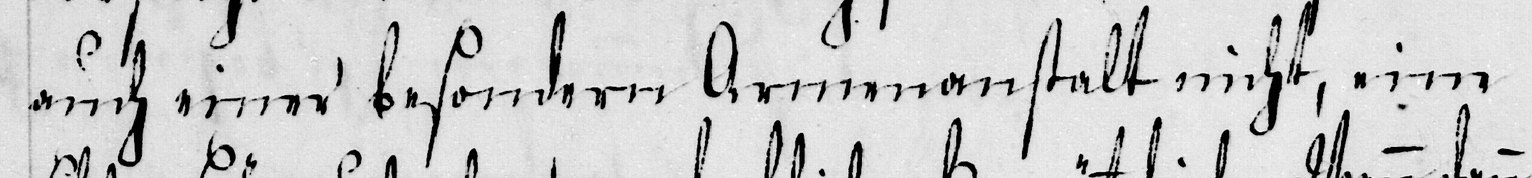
auch einer besonderen Armenanstalt nicht, eine
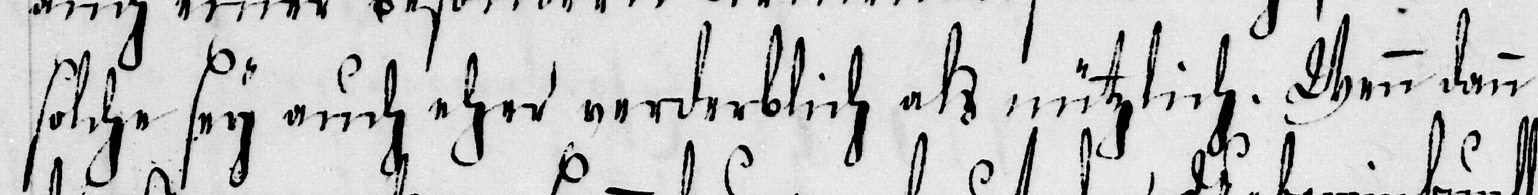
solche sey auch eher verderblich als nützlich. Wenn dan¬
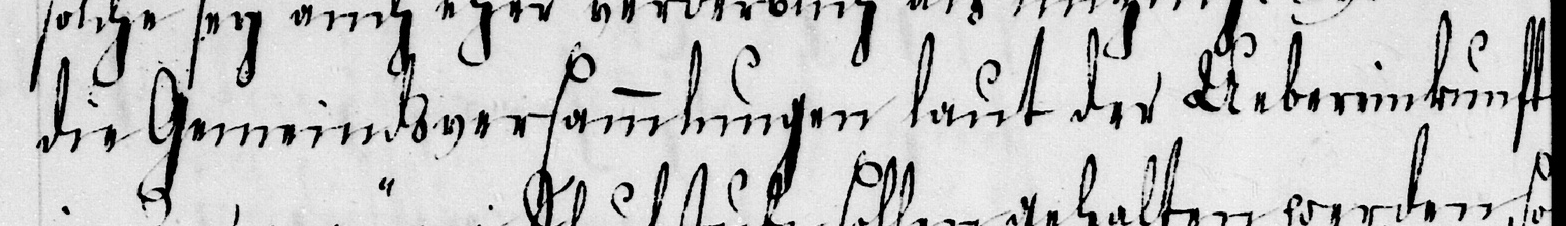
die Gemeindsversammlungen laut der Uebereinkunft
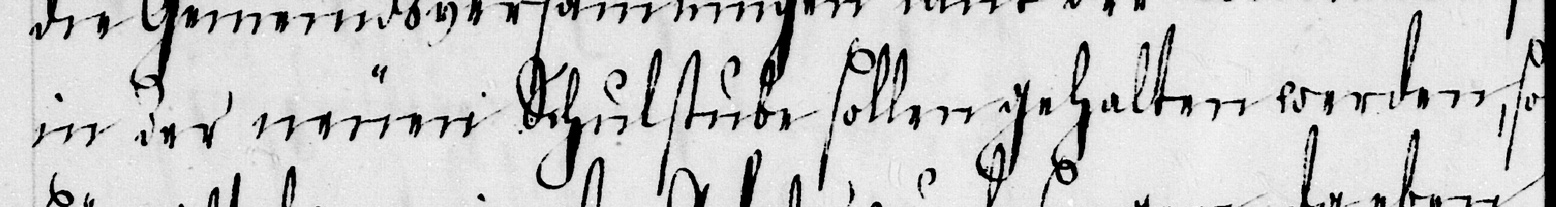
in der neuen Schulstube sollen gehalten werden, so
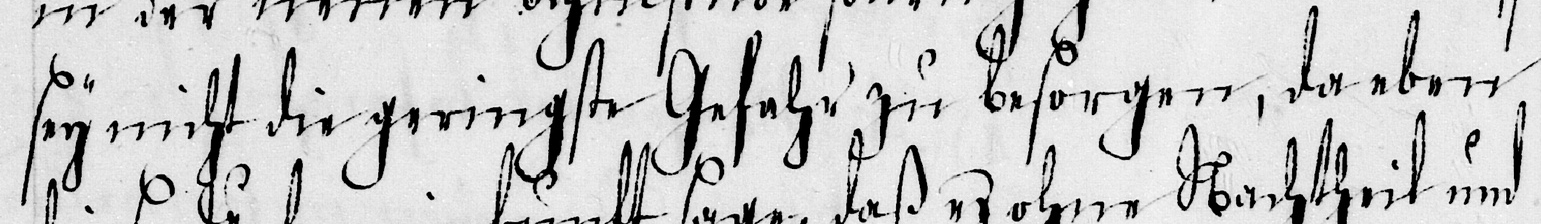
sey nicht die geringste Gefahr zu besorgen, da eben
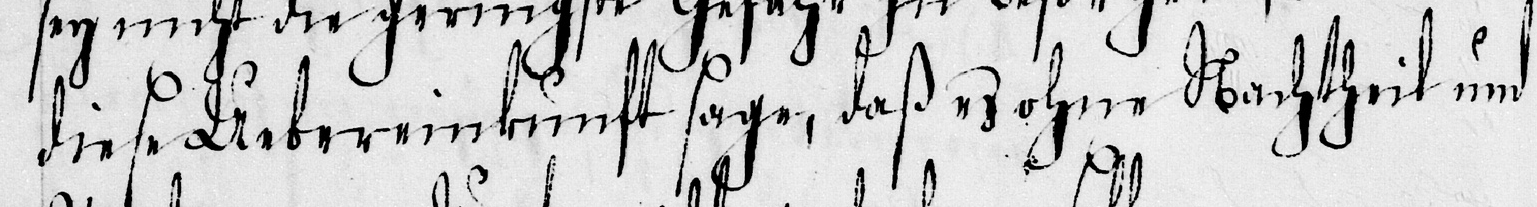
diese Uebereinkunft sage, daß es ohne Nachtheil und
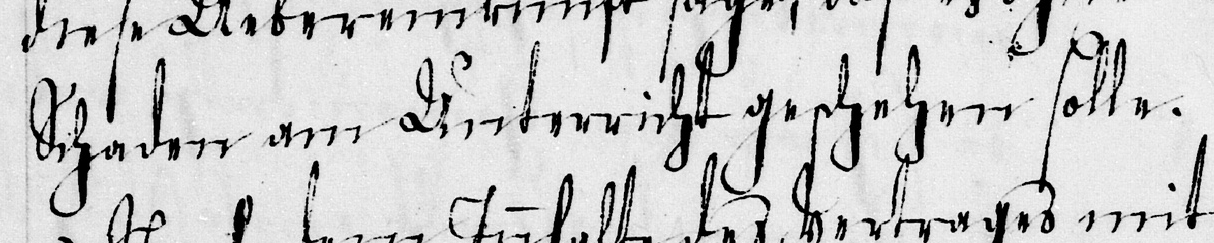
Schaden am Unterricht geschehen solle.
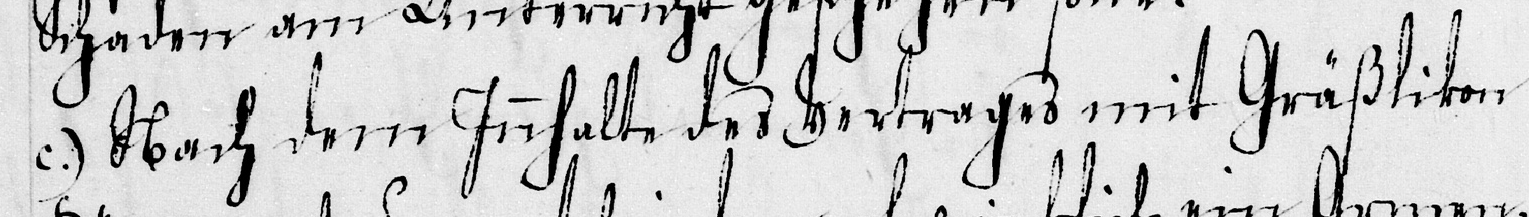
c.) Nach dem Innhalte des Vertrages mit Gräßlikon
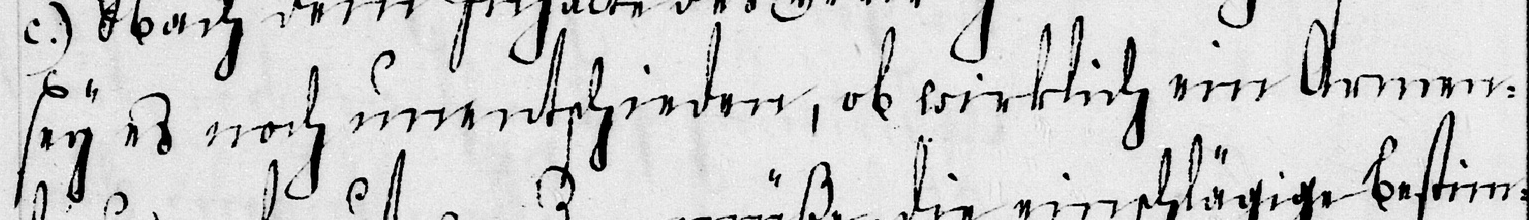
sey es noch unentschieden, ob wirklich ein Armen¬
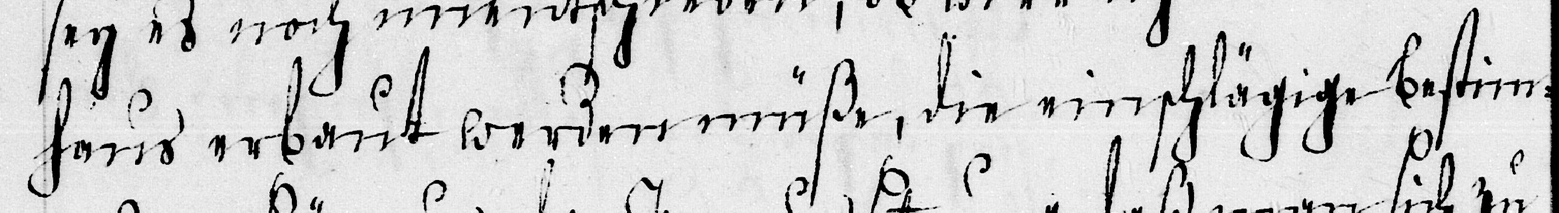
haus erbaut werden müße, die einschlägige Bestim¬
